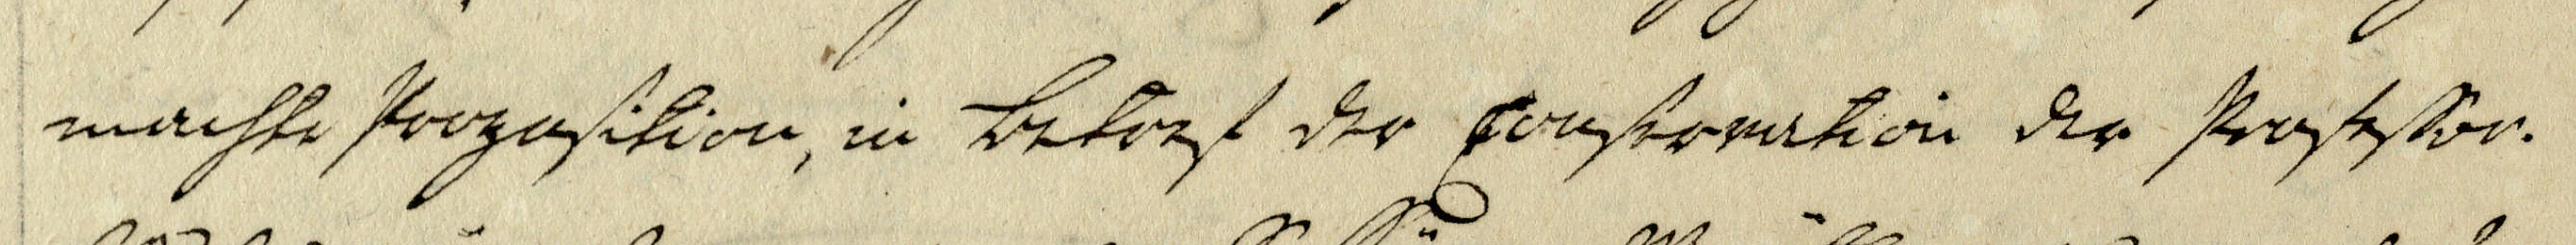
machte Proposition, in Betref der Conservation der Professor¬
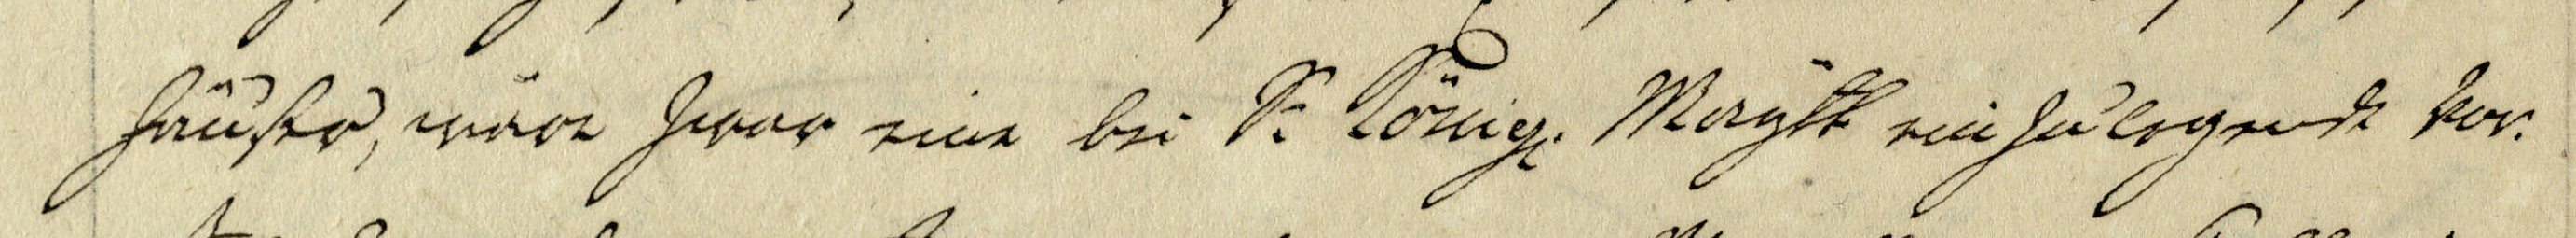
häuser, wäre zwar eine bei Sr. König. Maÿtt einzulegende Vor¬
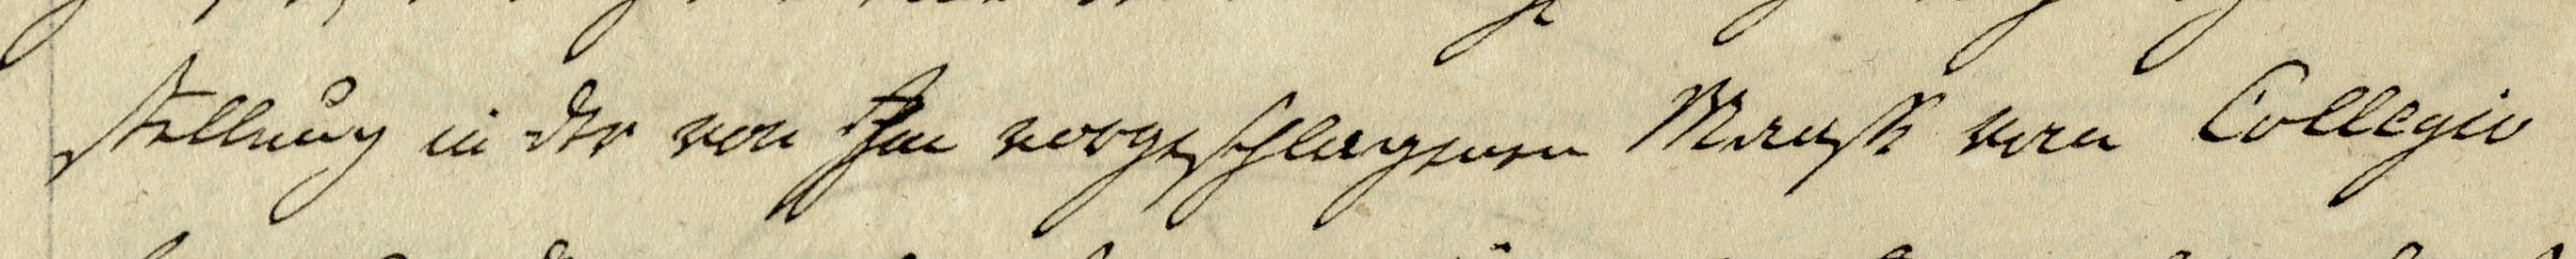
stellung in der von Ihm vorgeschlagenen Maasse vom Collegio
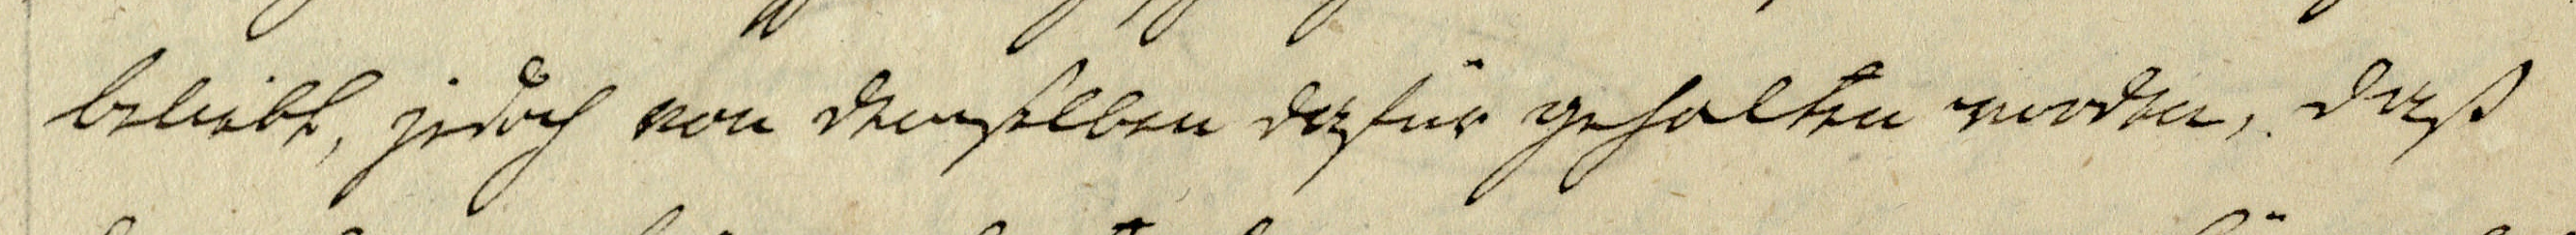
beliebt, jedoch von demselben dafür gehalten worden, daß
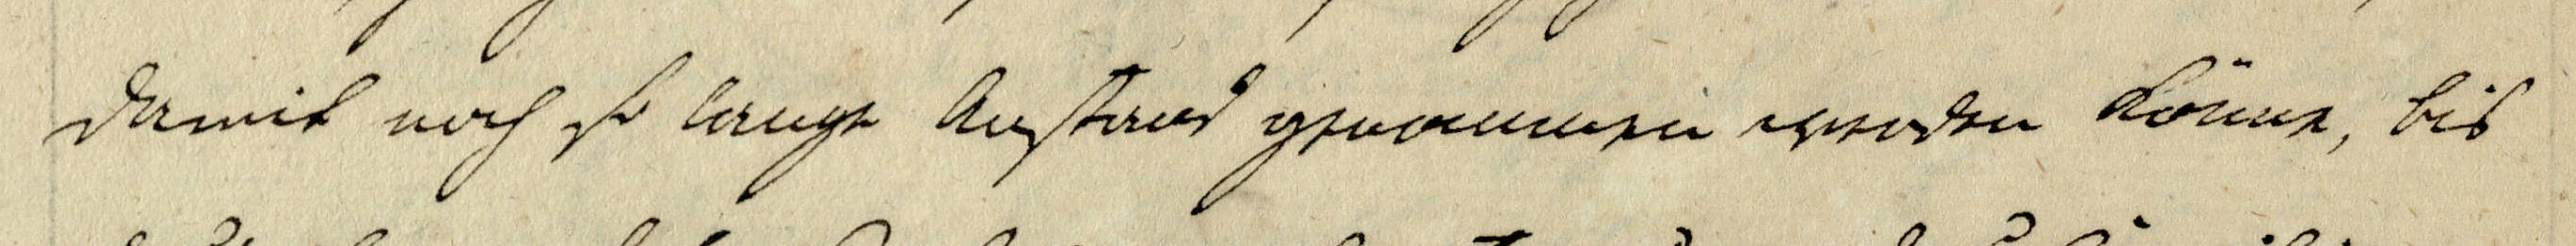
damit noch so lange Anstand genommen werden könne, bis
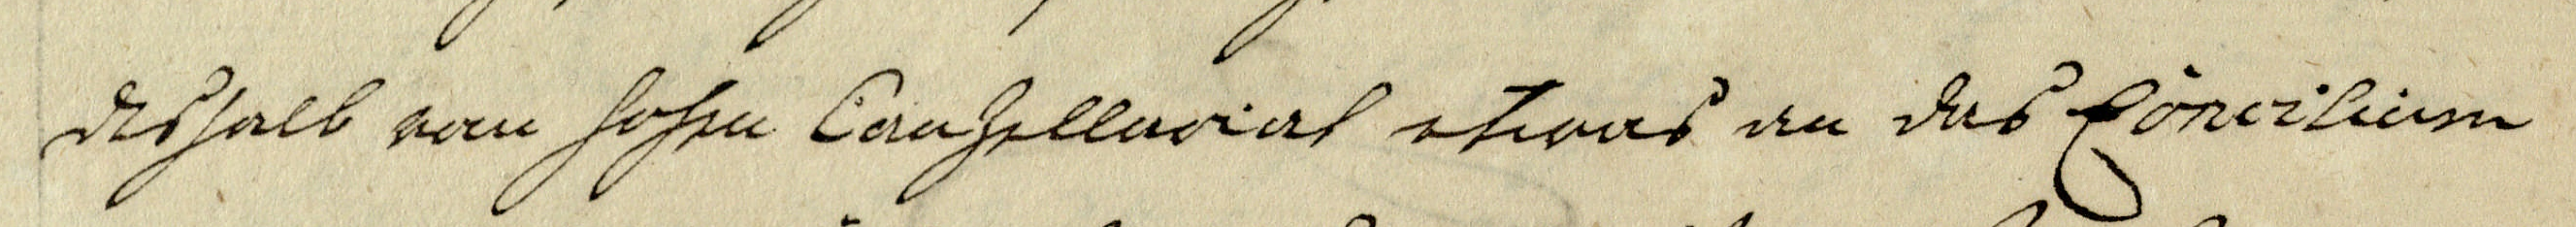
deshalb vom hohen Canzellariat etwas an das Concilium
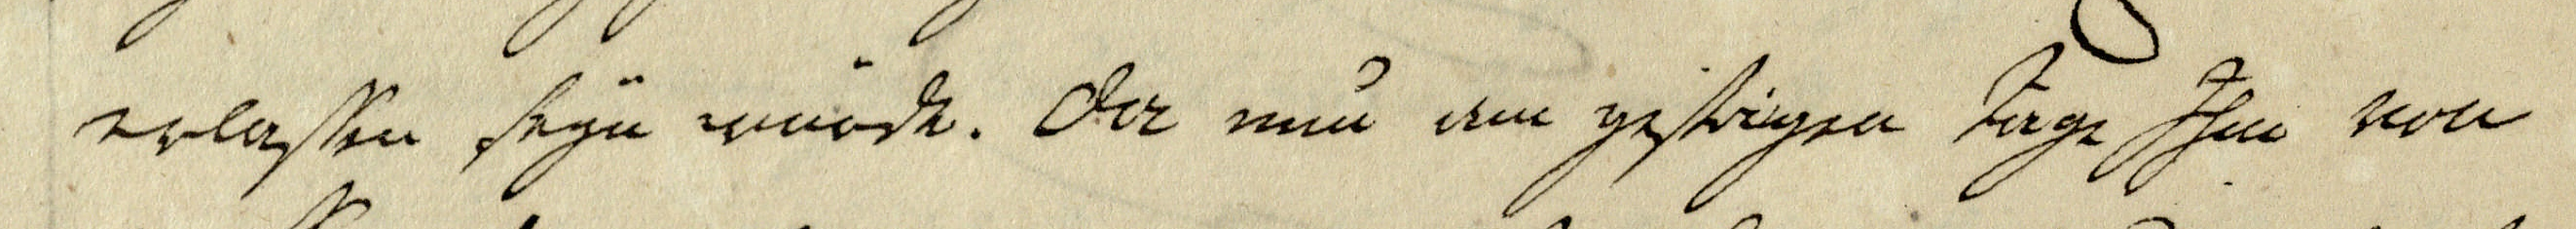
erlassen seÿn würde. Da nun am gestrigen Tage Ihm von
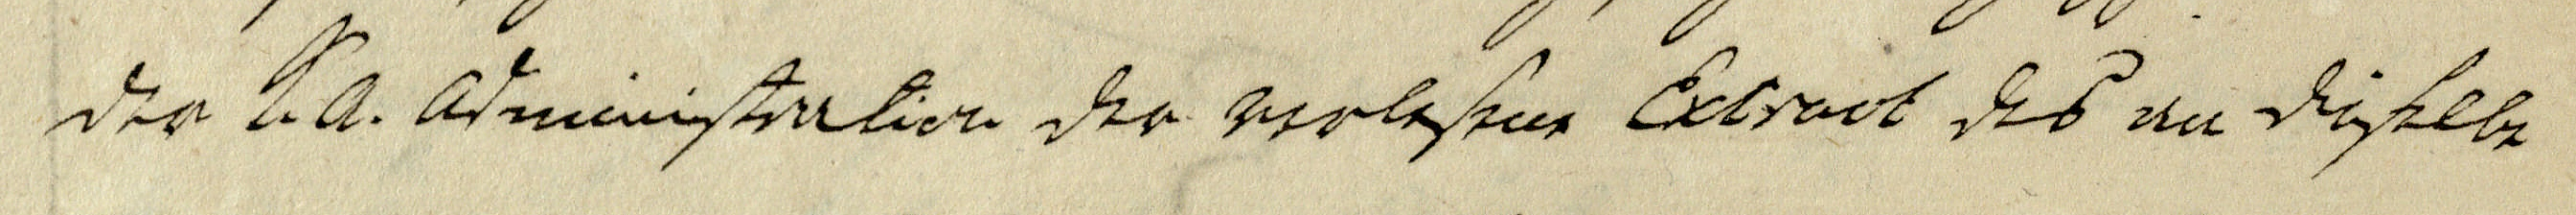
der K. A. Administration der verlesene Extract des an dieselbe
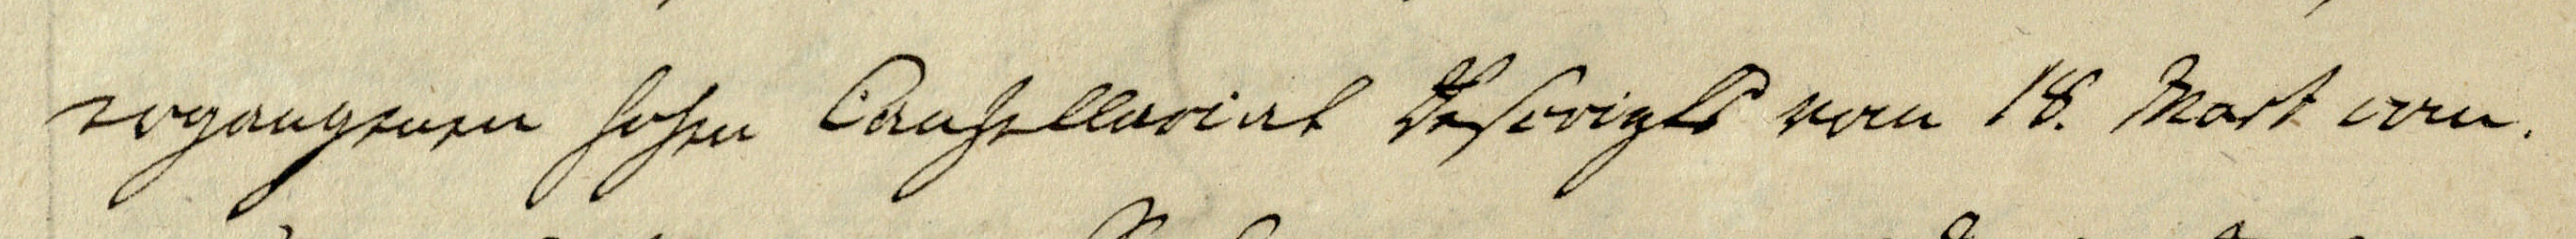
ergangenen hohen Canzellariat Rescripts vom 18. Mart com¬
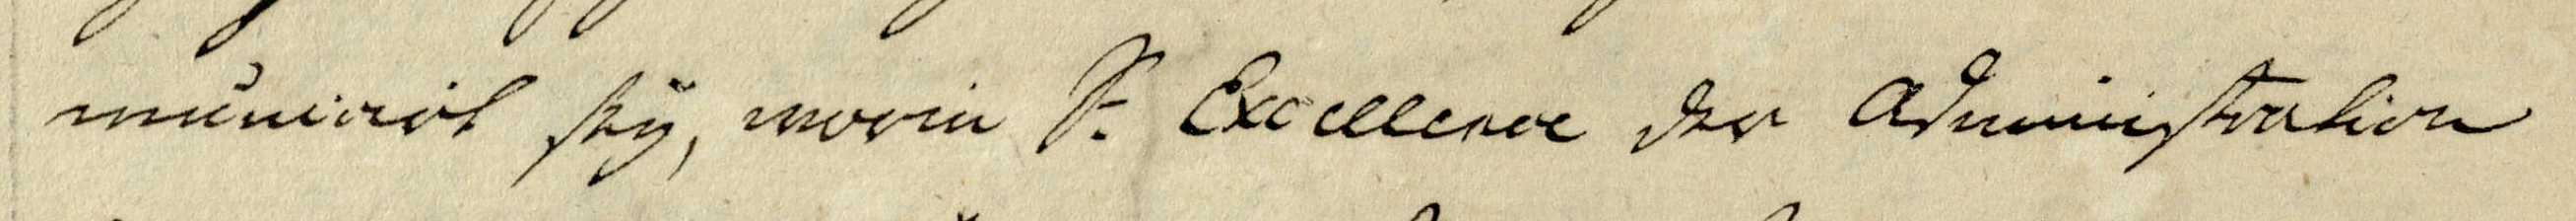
municirt seÿ, worin Sr. Excellence der Administration
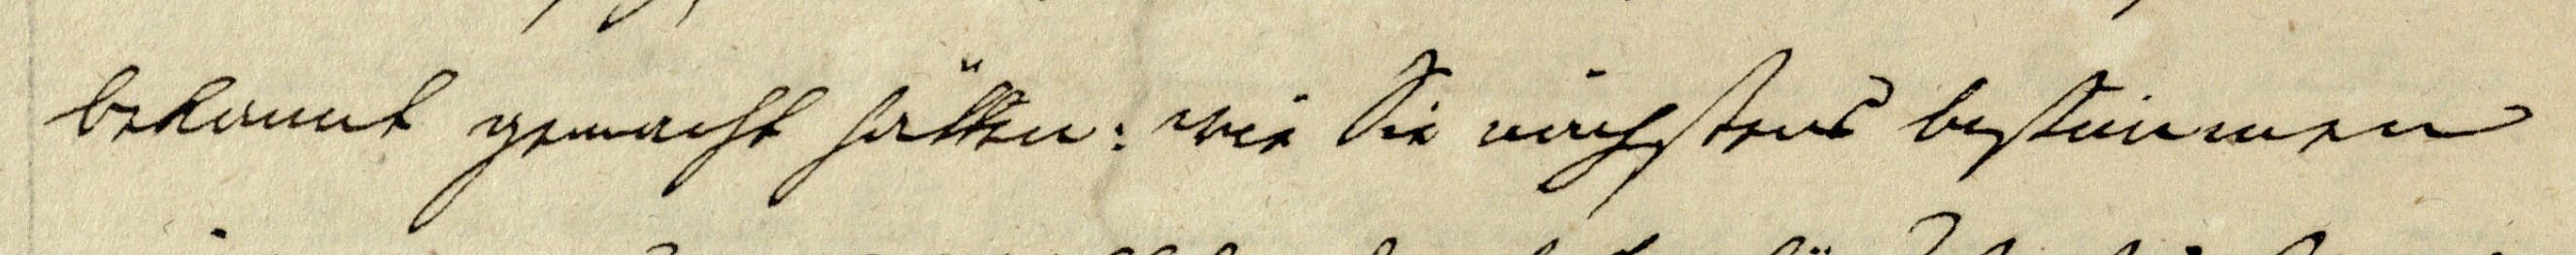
bekannt gemacht hätten: wie Sie nächstens bestimmen
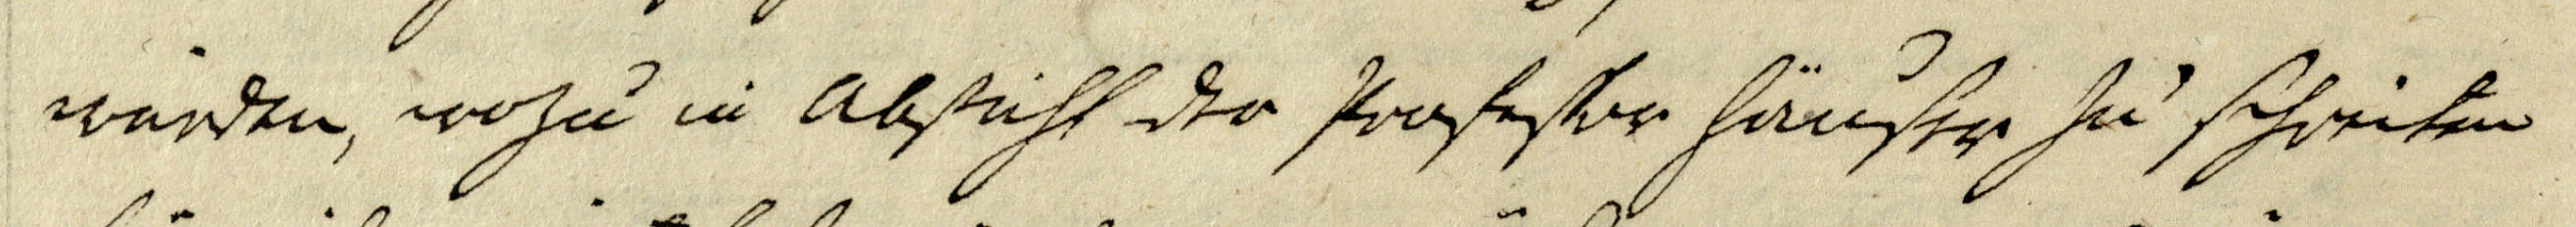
würden, wozu in Absicht der Professor Häuser zu schreiten
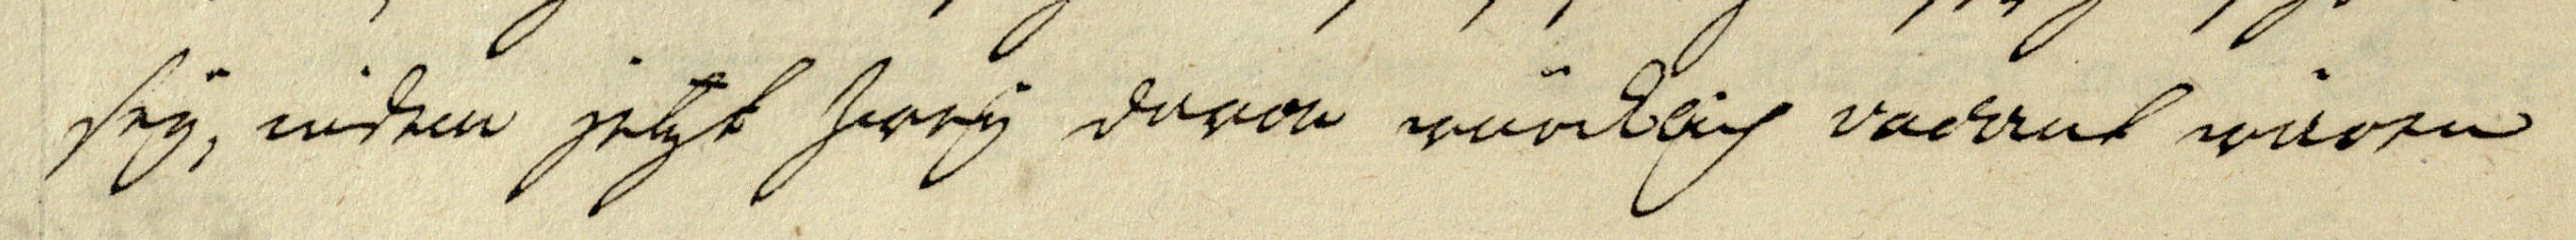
seÿ, indem jetzt zweÿ davon würcklich vacant wären
